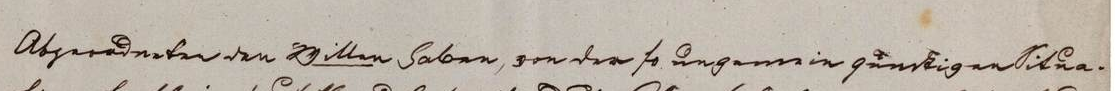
Abgeordneten den Willen haben, von der so ungemein günstigen Situa-
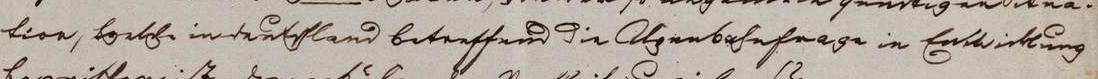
tion, welche in Deutschland betreffend die Alpenbahnfrage in Entwicklung
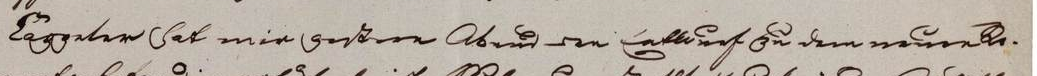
Cappeler hat mir gestern Abend den Entwurf zu dem neuen Re-
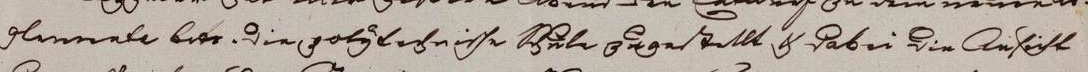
glemente betr. die polytechnische Schule zugestellt & dabei die Ansicht
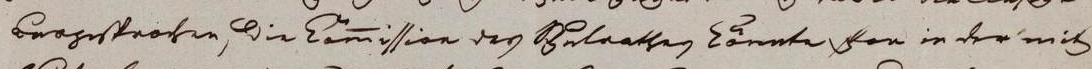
ausgesprochen, die Commission des Schulrathes könnte schon in der mit
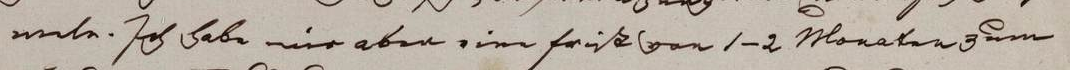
meln. Ich habe mir aber eine Frist von 1–2 Monaten zum
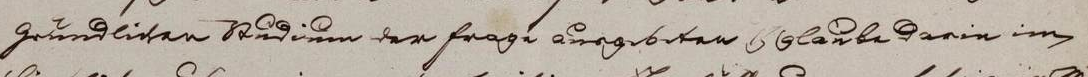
gründlichen Studium der Frage ausgebeten & glaube darin im
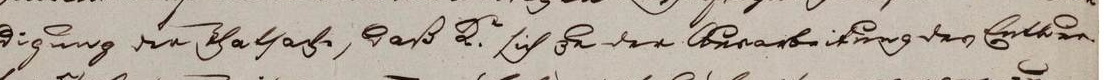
digung der Thatsache, daß K. sich zu der Ausarbeitung des Entwur-
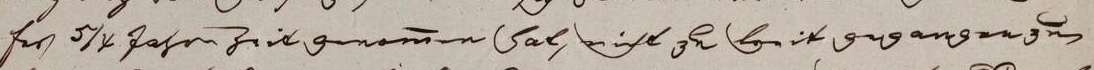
fes 5/4 Jahre Zeit genommen hat, nicht zu weit gegangen zu
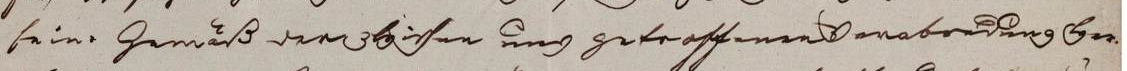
sein. Gemäß der zwischen uns getroffenen Verabredung wer-
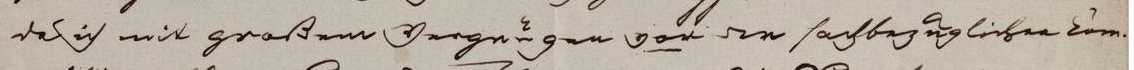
de ich mit großem Vergnügen vor der sachbezüglichen Com-
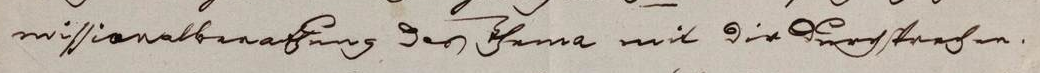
missionalberathung das Thema mit Dir durchsprechen.
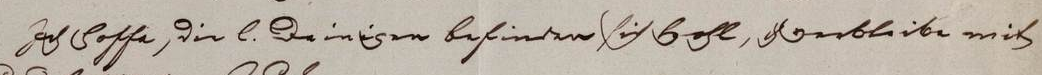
Ich hoffe, die l. Deinigen befinden sich wohl, & verbleibe mit
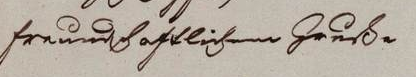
freundschaftlichem Gruße
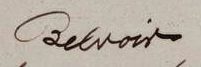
Belvoir
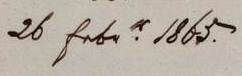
26. Febrr 1865.
